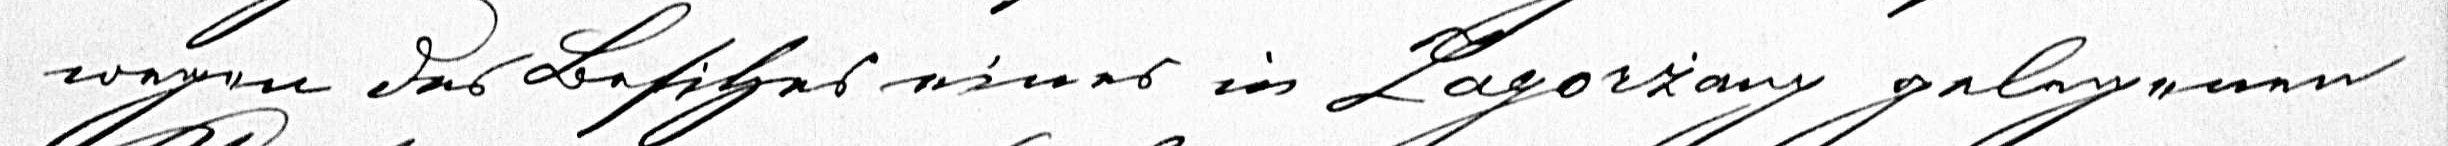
wegen des Besitzes eines in Zagorżany gelegenen
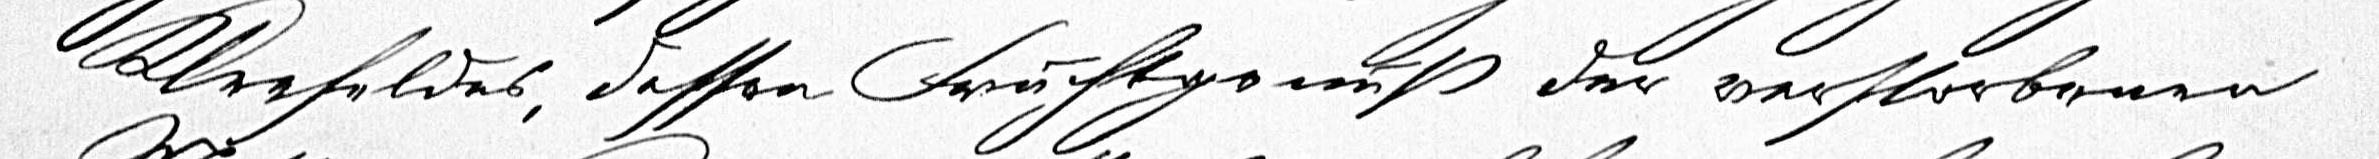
Kleefeldes, dessen Fruchtgenuß der verstorbenen
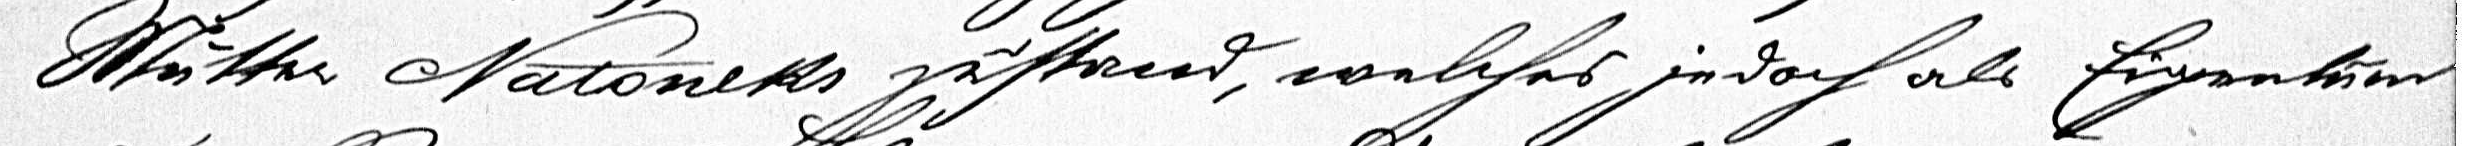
Mutter Natoneks gustand, welches jedoch als Eigentum
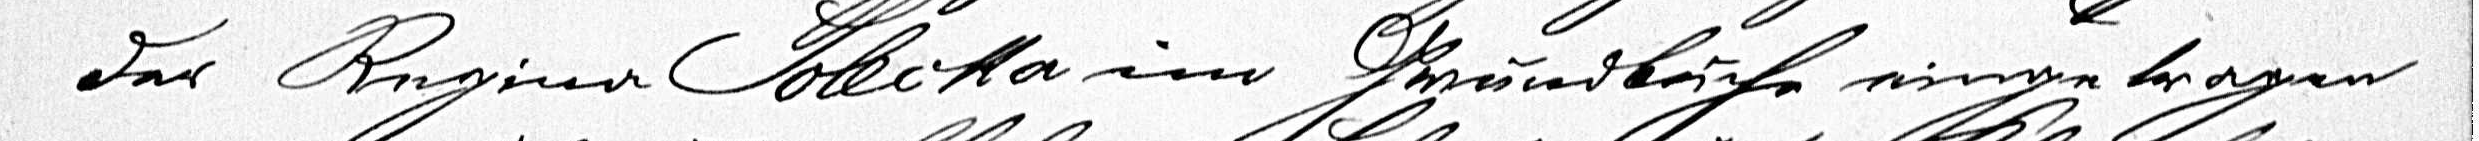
der Regina Solecka im Grundbuche eingetragen
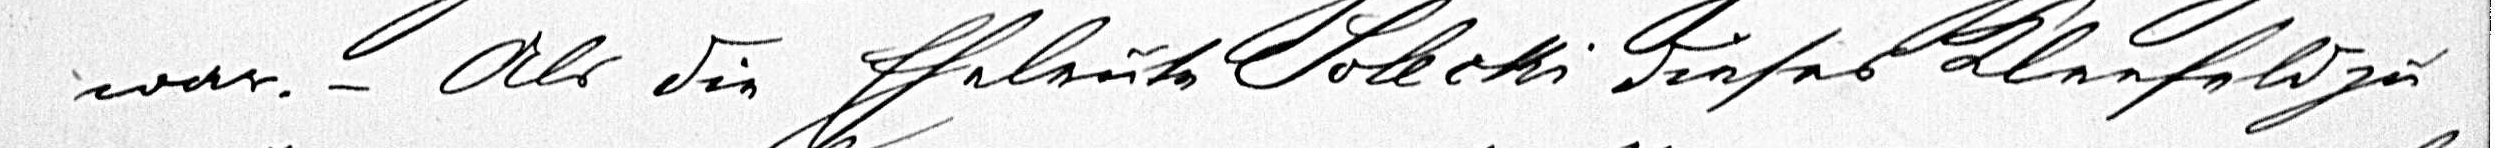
war. Als die Eheleute Solecki dieses Kleefeld zu
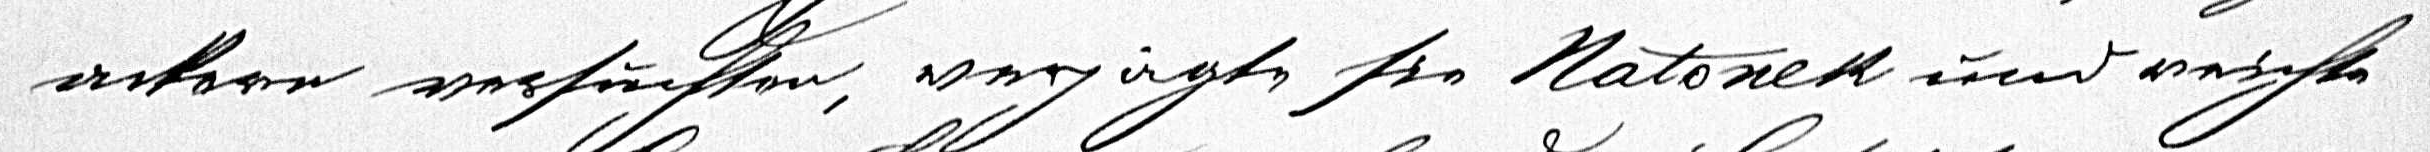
ackern versuchten, verjagte sie Natonek und reichte
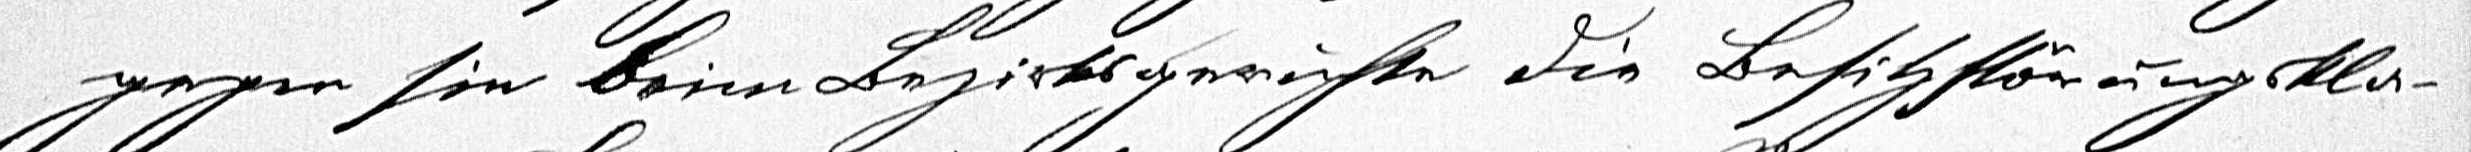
gegen sie beim Bezirksgerichte die Besitzstörungskla¬
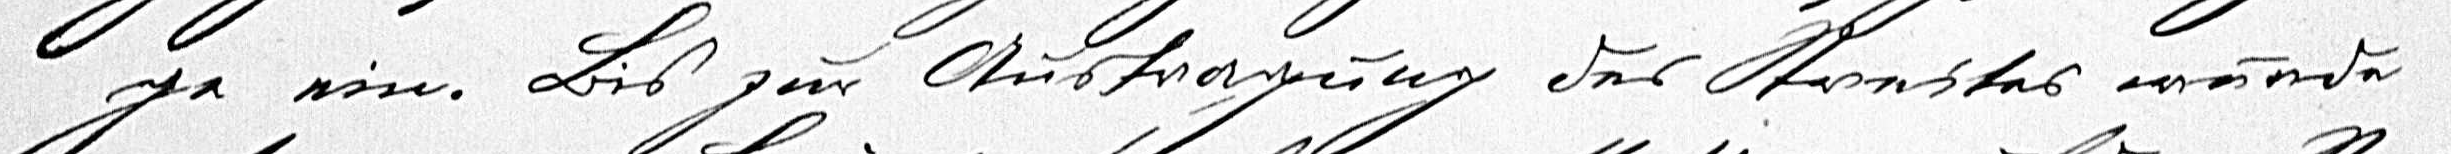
ge ein. Bis zur Austragung des Streites wurde
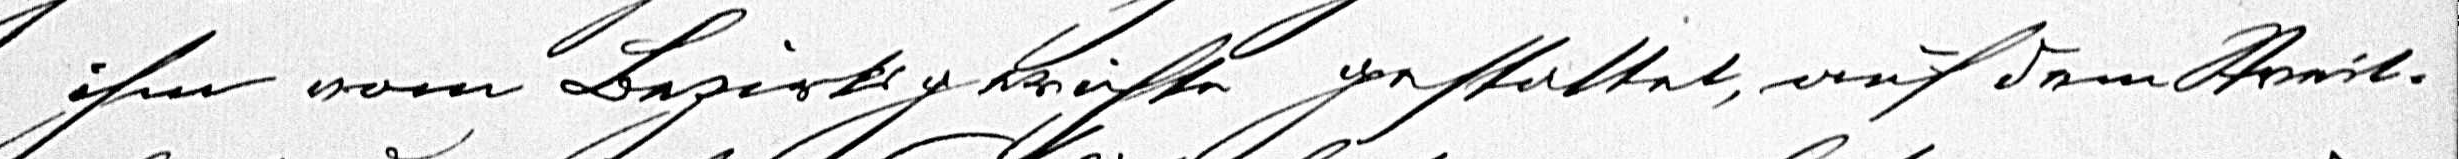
ihm vom Bezirksgerichte gestattet, auf dem Streit¬
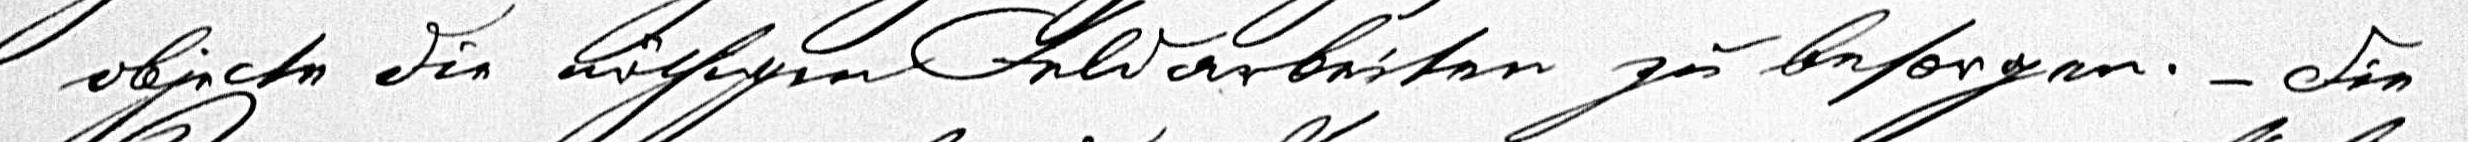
objecte die nöthigen Feldarbeiten zu besorgen. Die
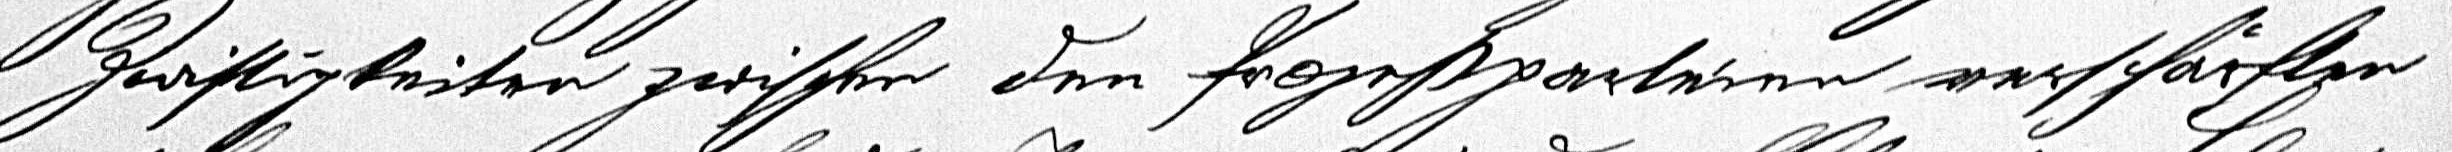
Zwistigkeiten zwischen den Prozeßparteien verschärften
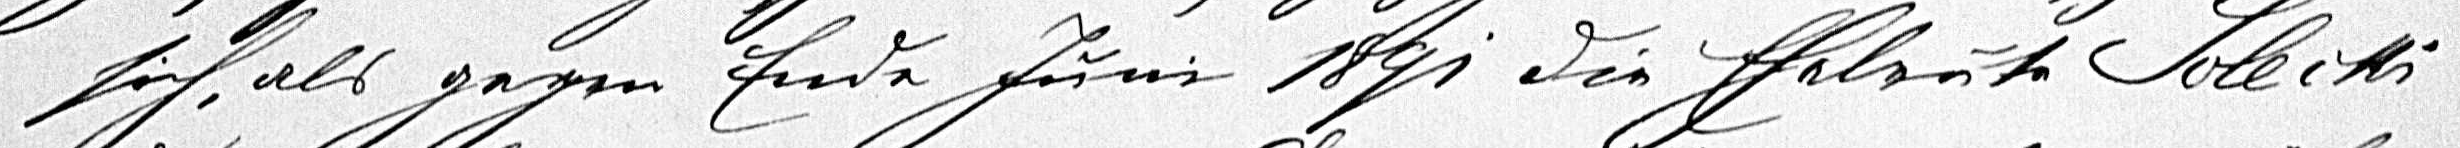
sich, als gegen Ende Juni 1891 die Eheleute Solecki
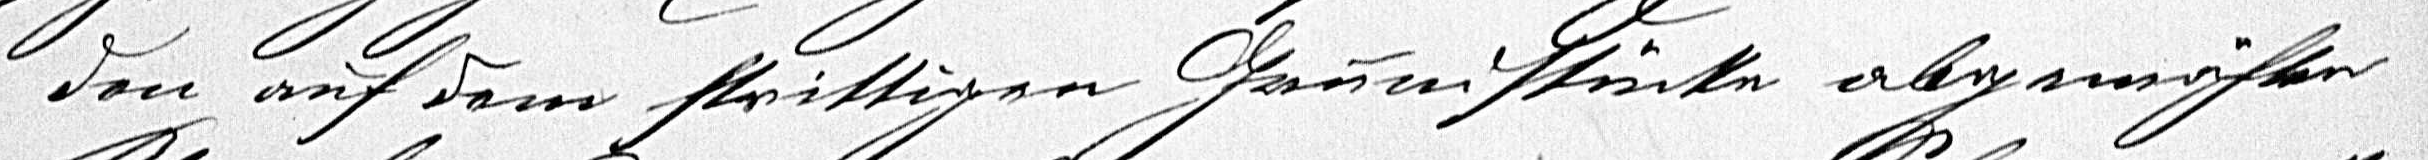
den auf dem strittigen Grundstücke abgemähten
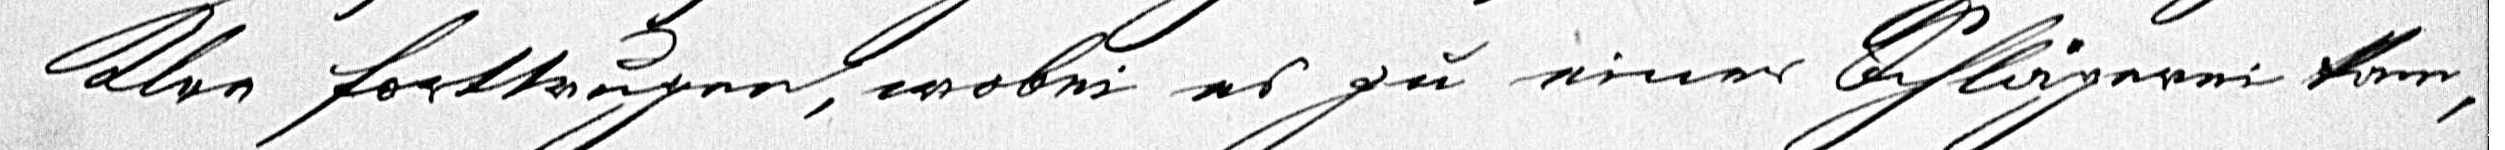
Klee forttrugen, wobei es zu einer Schlägerei kam,
